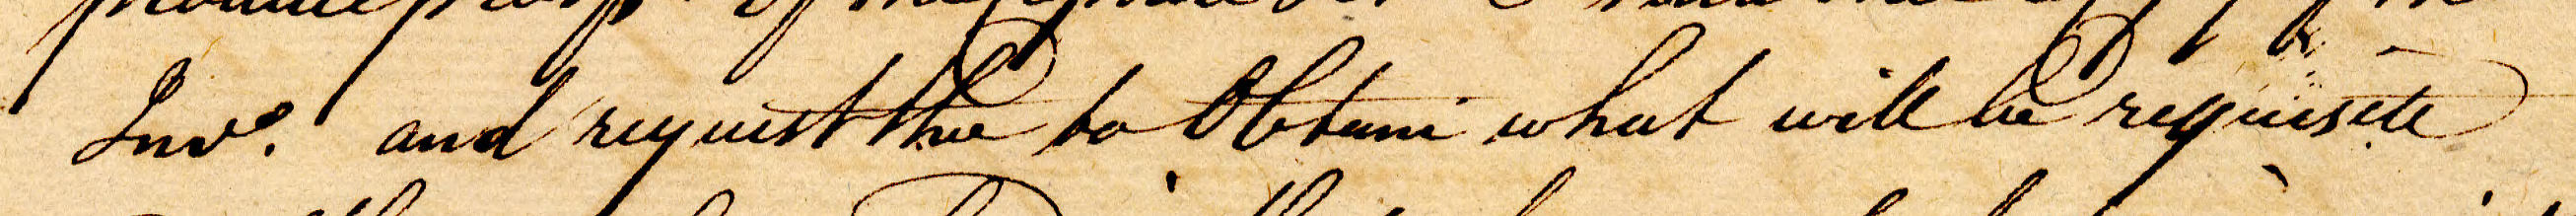Inv^o. and request thee to Obtain what will be requested
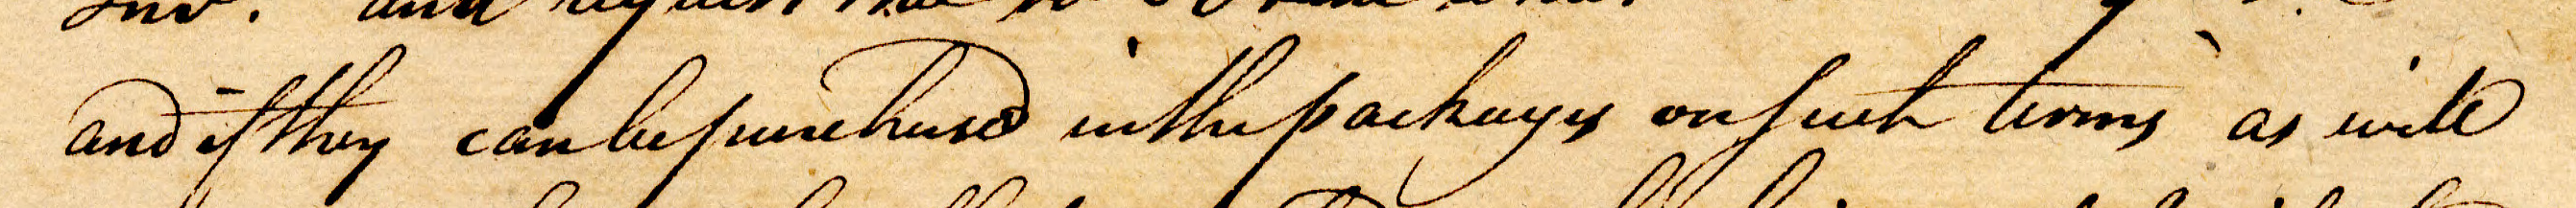and if they can be purchased in the packages on such terms as will
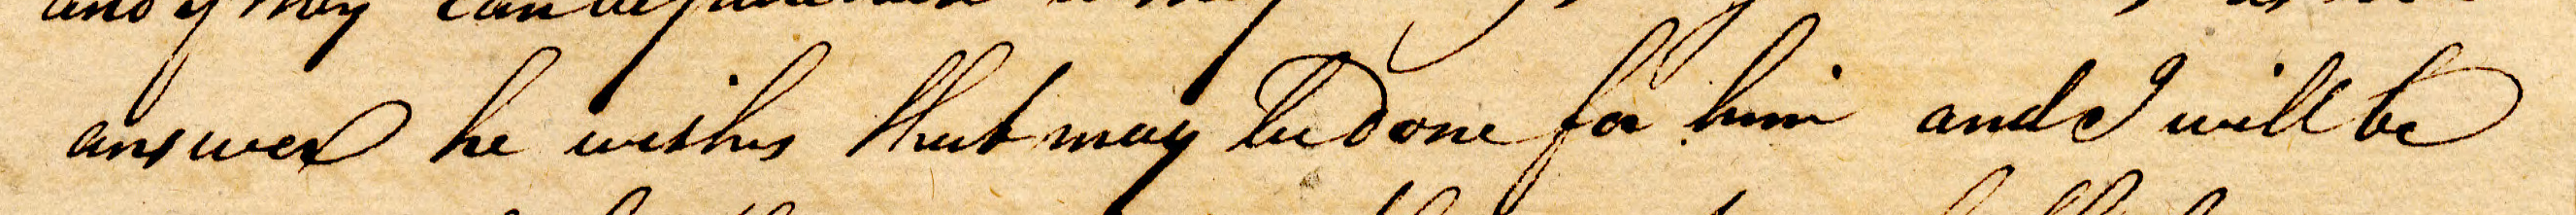answer he wishes that may be done for him and I will be
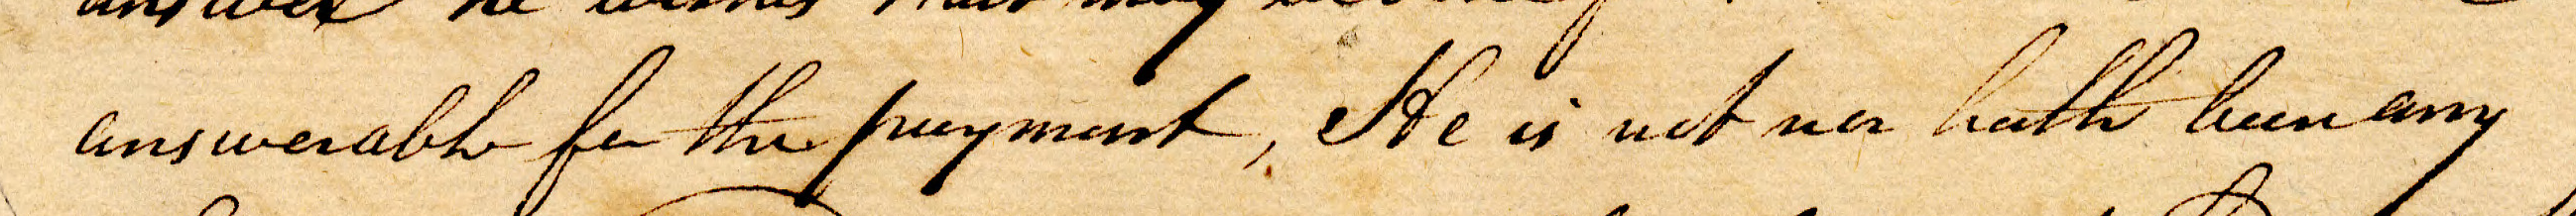answerable for the payment. He is not nor hath been any
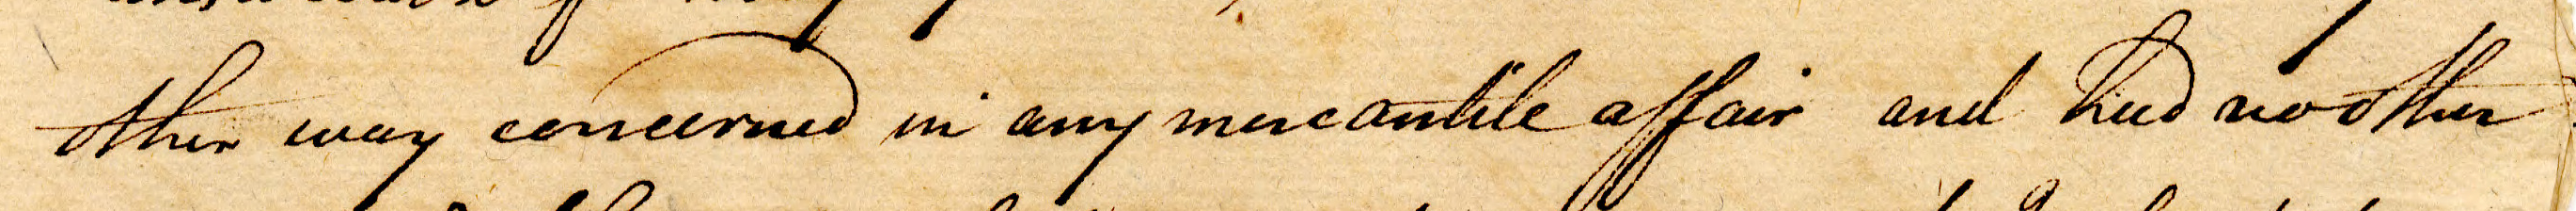other way concerned in any mercantile affair and had no other
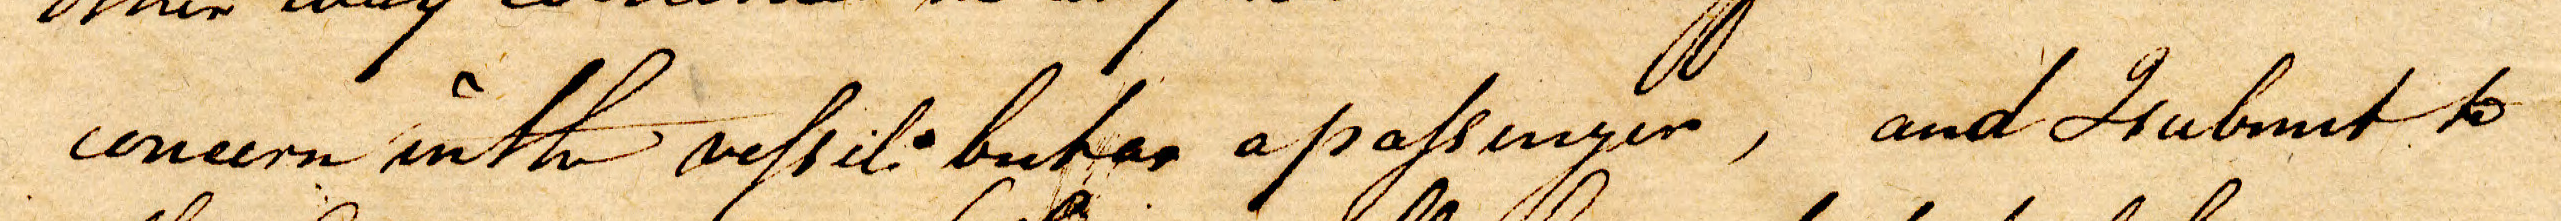concern in the vessel but as a passenger, and I submit to
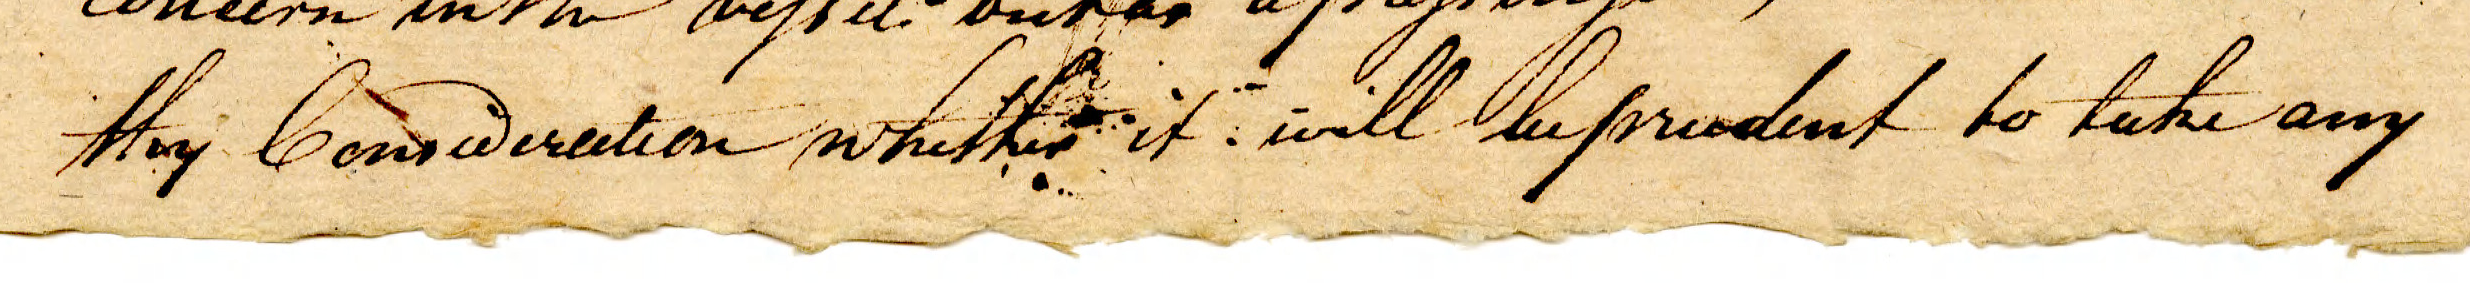thy Consideration whether it will be prudent to take any
